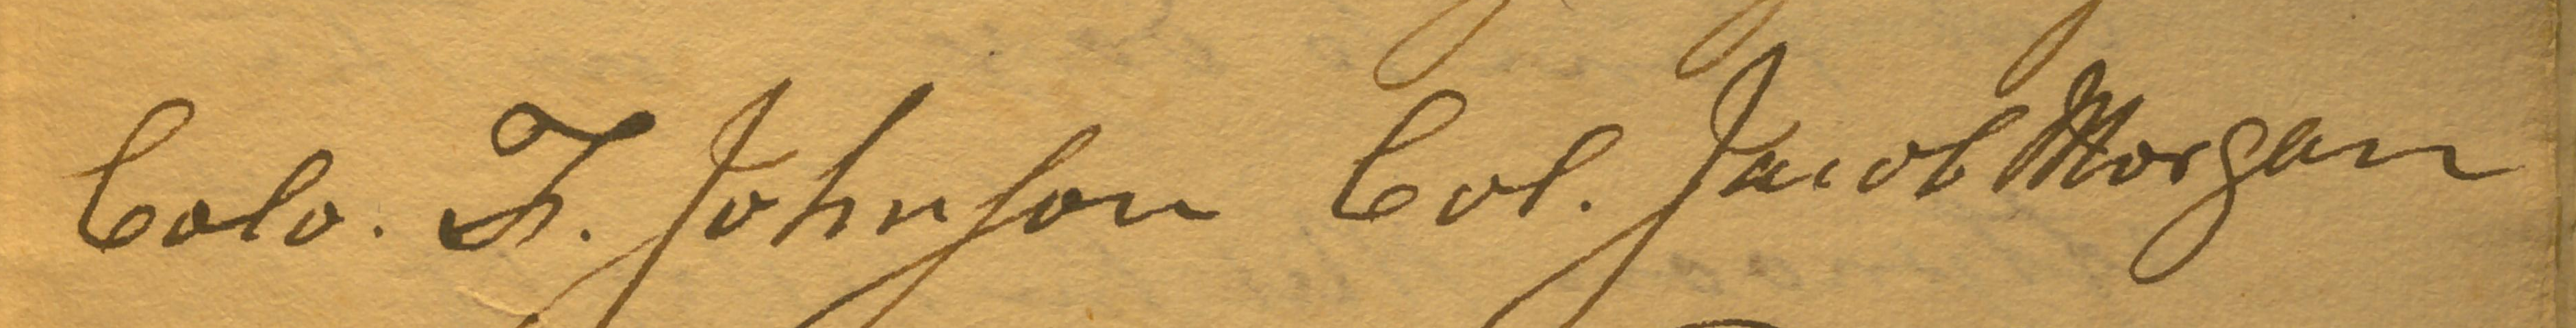Colo. F. Johnson Col. Jacob Morgan
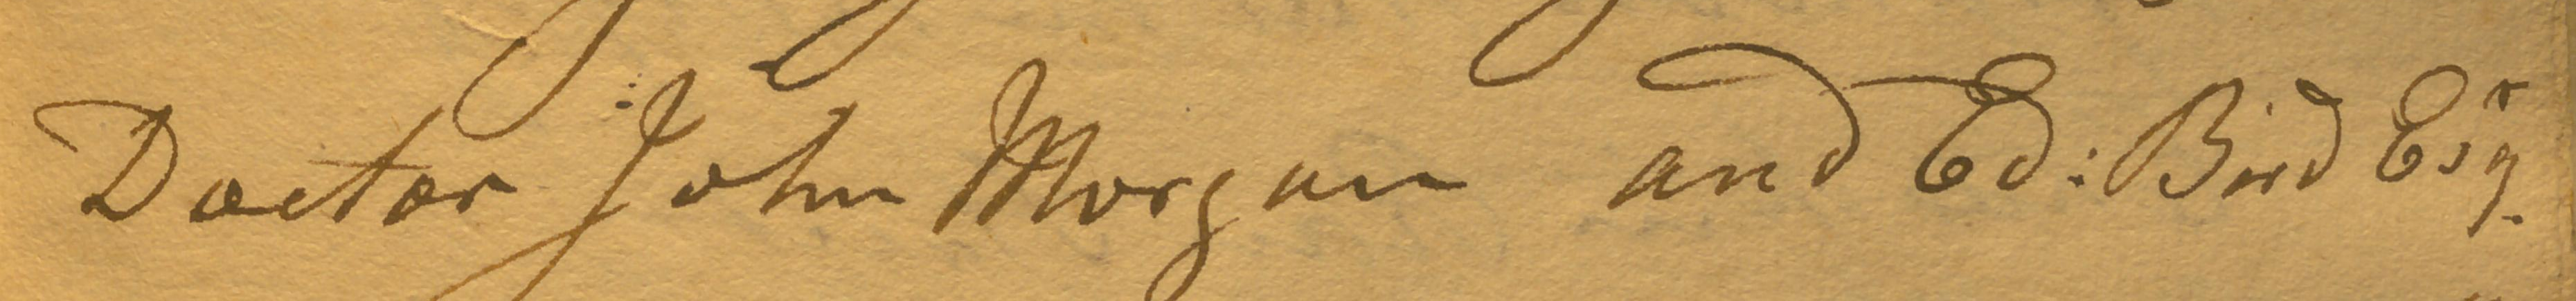Doctor John Morgan, and Ed: Bird Esq^r.
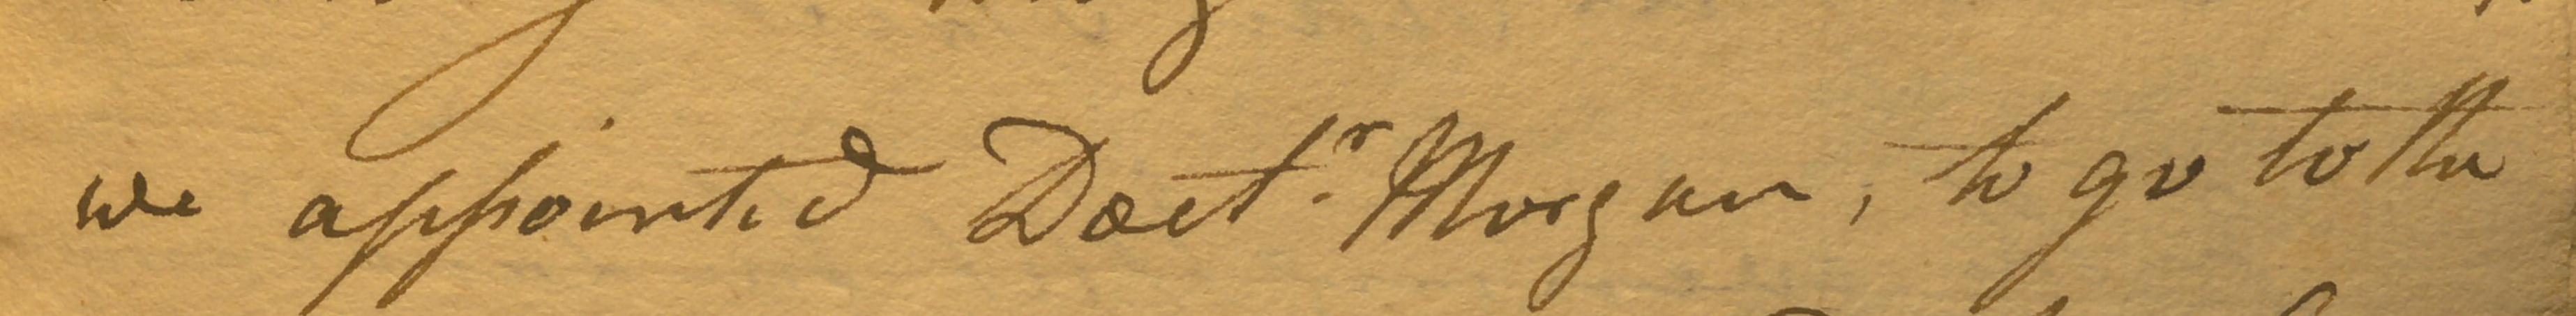we appointed Doct^r. Morgan, to go to the
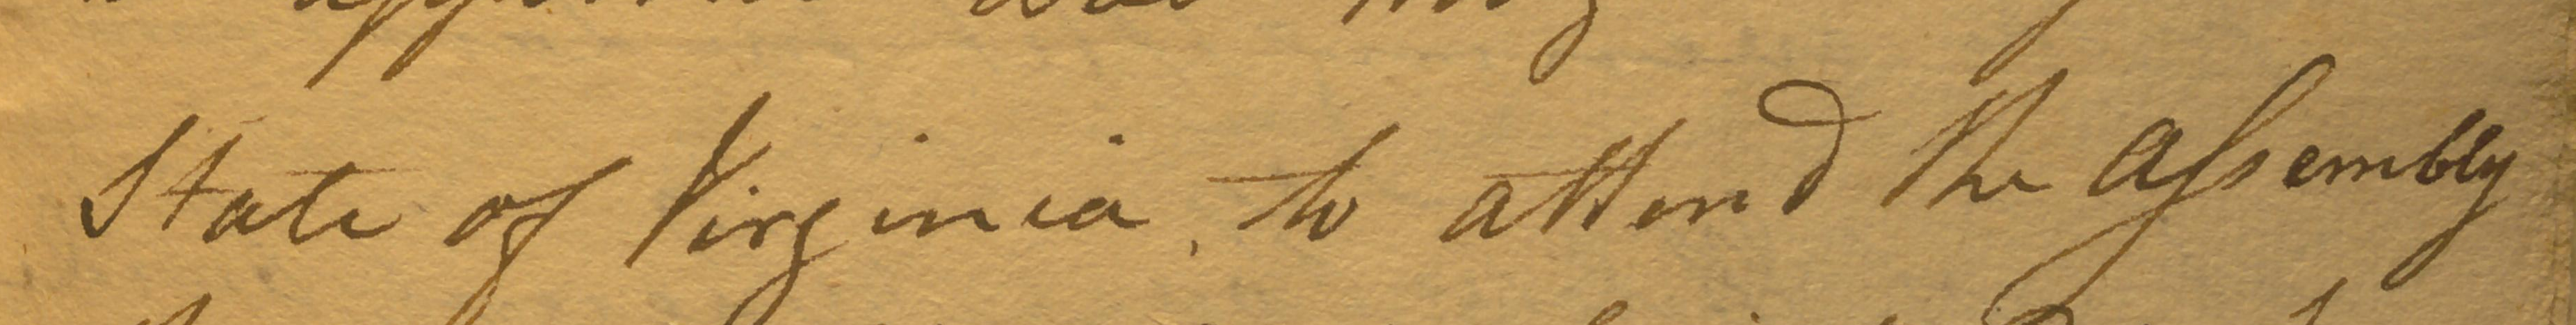State of Virginia to attend the Assembly
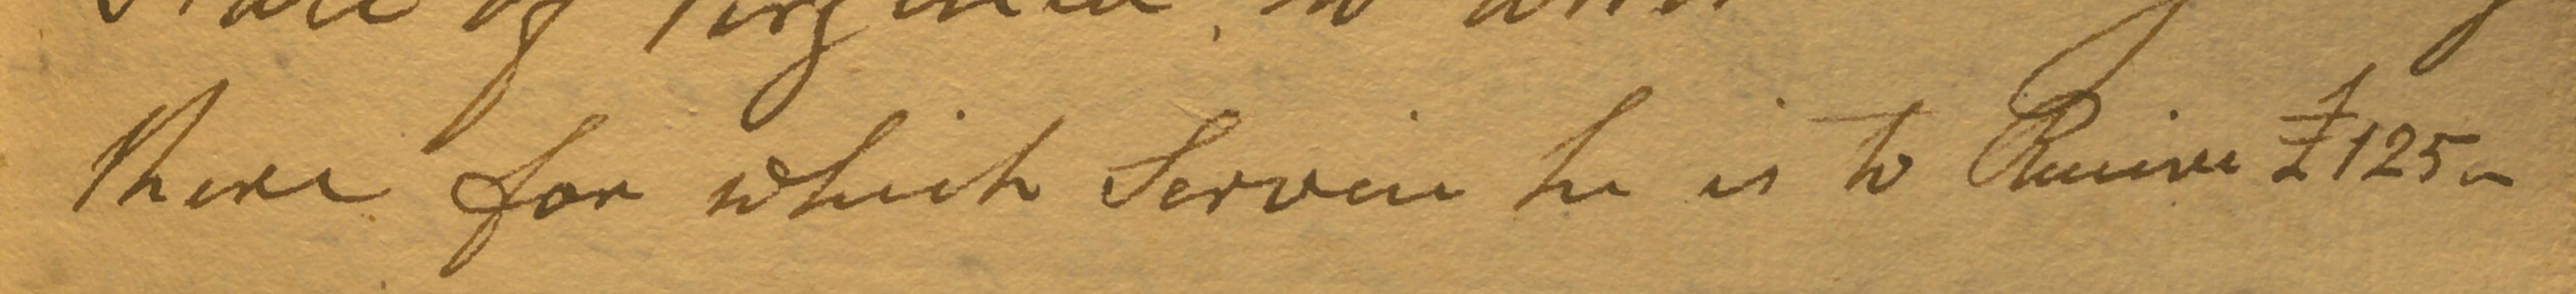there, for which service he is to Ruceive £125-
